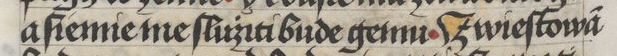a ſiemie me ſlużiti bude gemu.Zwieſtowā
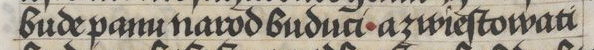bude panu narod buducí.a zwieſtowati
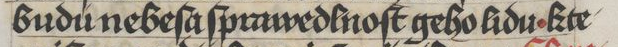budu nebeſa ſprawedlnoſt geho lidu.kte¬
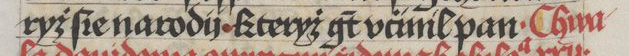ryż ſie narodij.kteryż ḡt uċinil pan.Chwa¬
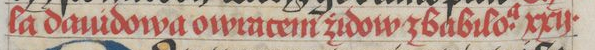la davidowa owratení żidow z babiloa.xxij.
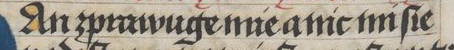Pan zprawuge mie a nic mi ſie
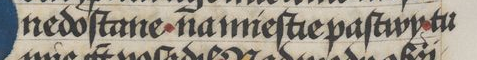nedoſtane.na mieſtie paſtwy.tu
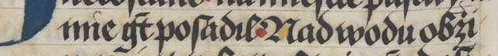mie ḡt poſadil.Nad wodu obżi¬
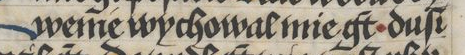weníe wychowal mie ḡt.duẛi
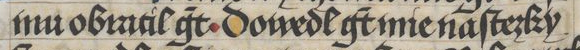mu obratil ḡt.Dowedl ḡt mie naſtezky
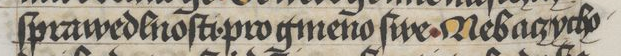ſprawedlnoſti.pro gmeno we.Neb acz ycho¬
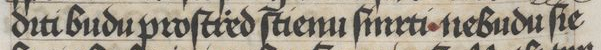diti budu proſtṙed ſtienu ſmrti.nebudu ſie
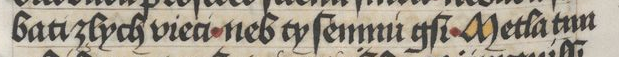bati zlych vieci.neb ty ſemnú gſi.Metla twa
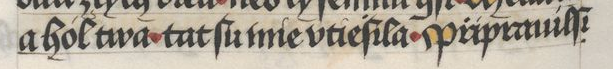a hól twa.tat ſu mie utieẛila.Pṙiprawilſi
